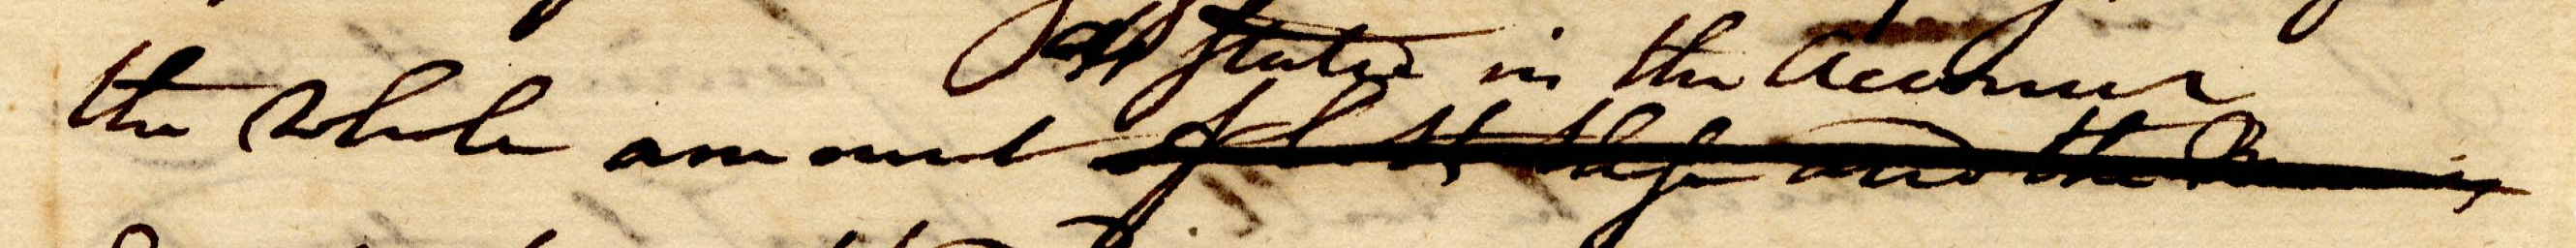the whole amount [________________________]
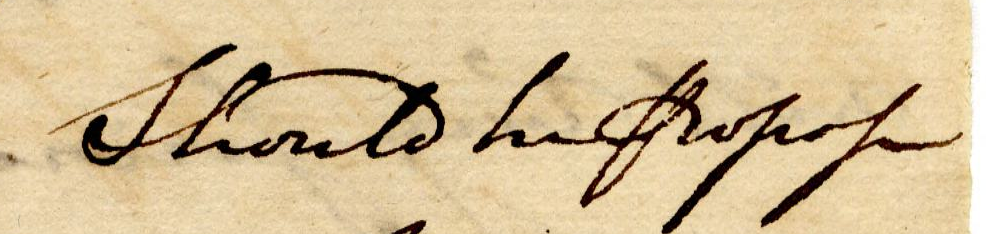Should he propose
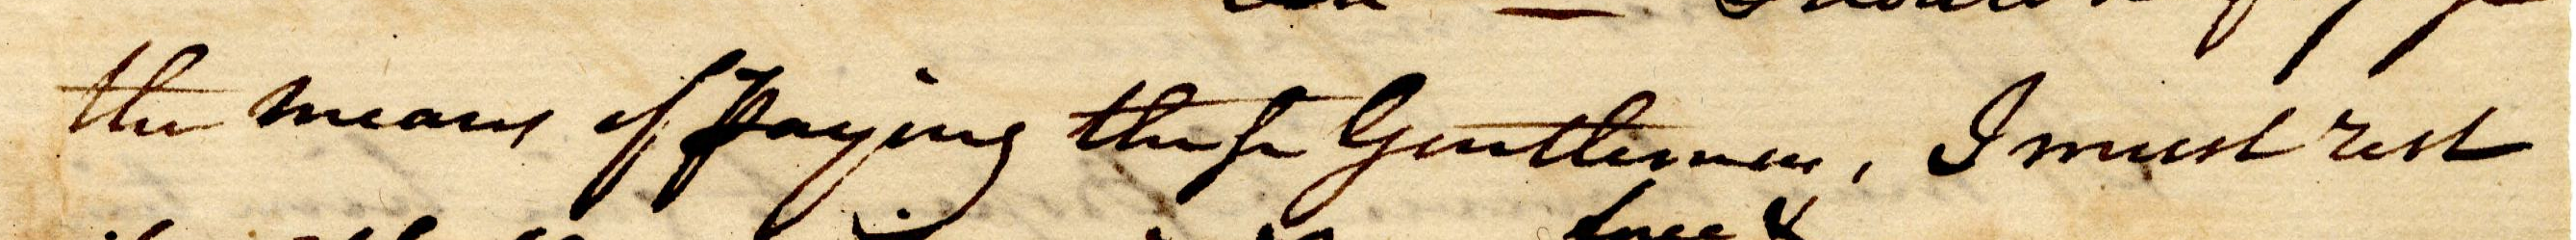the means of paying these gentlement, I must rest
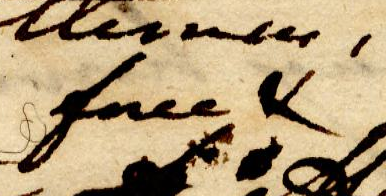force &
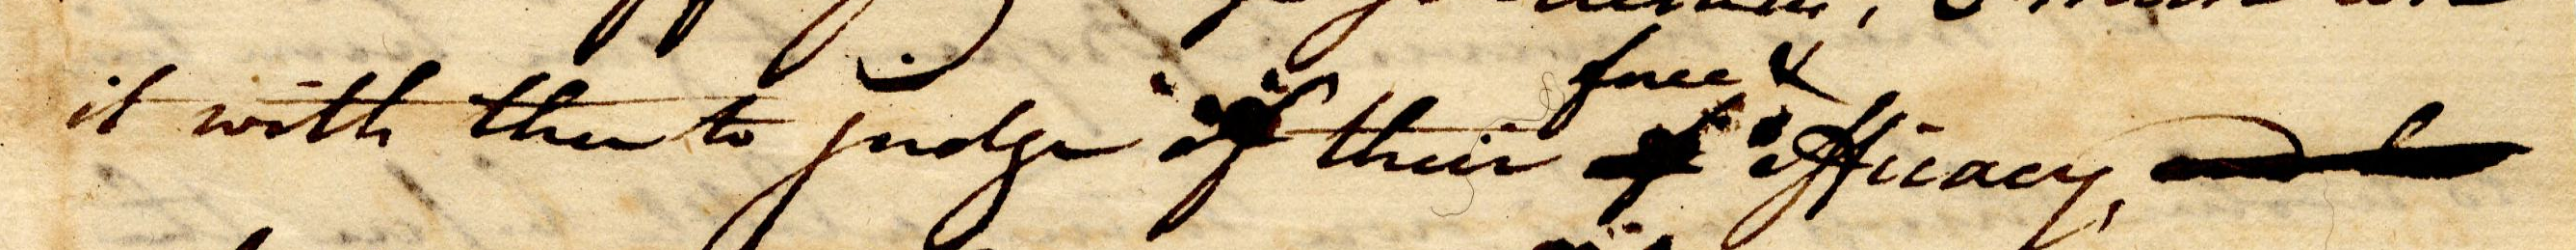it with then to judge if their [__] efficacy, [______]
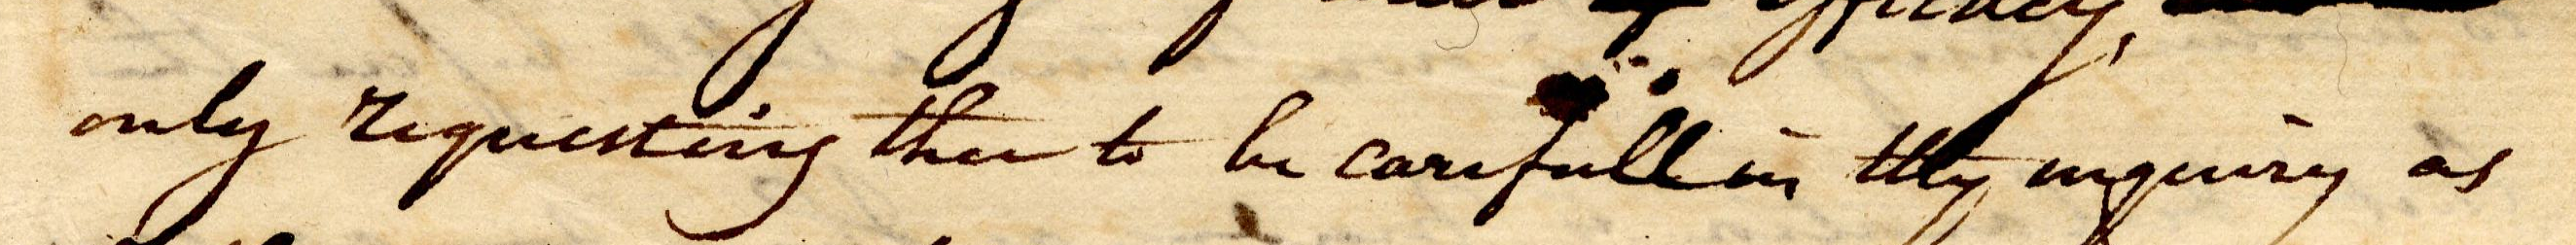only requesting then to be carefull in thy inquiry as
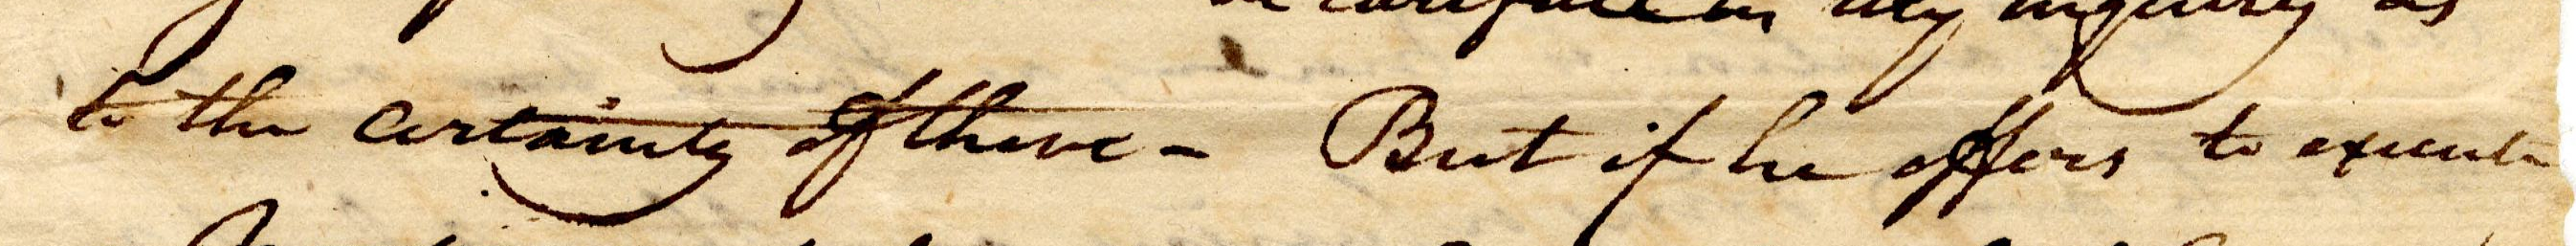to the certainty of those- But if he offers to execute
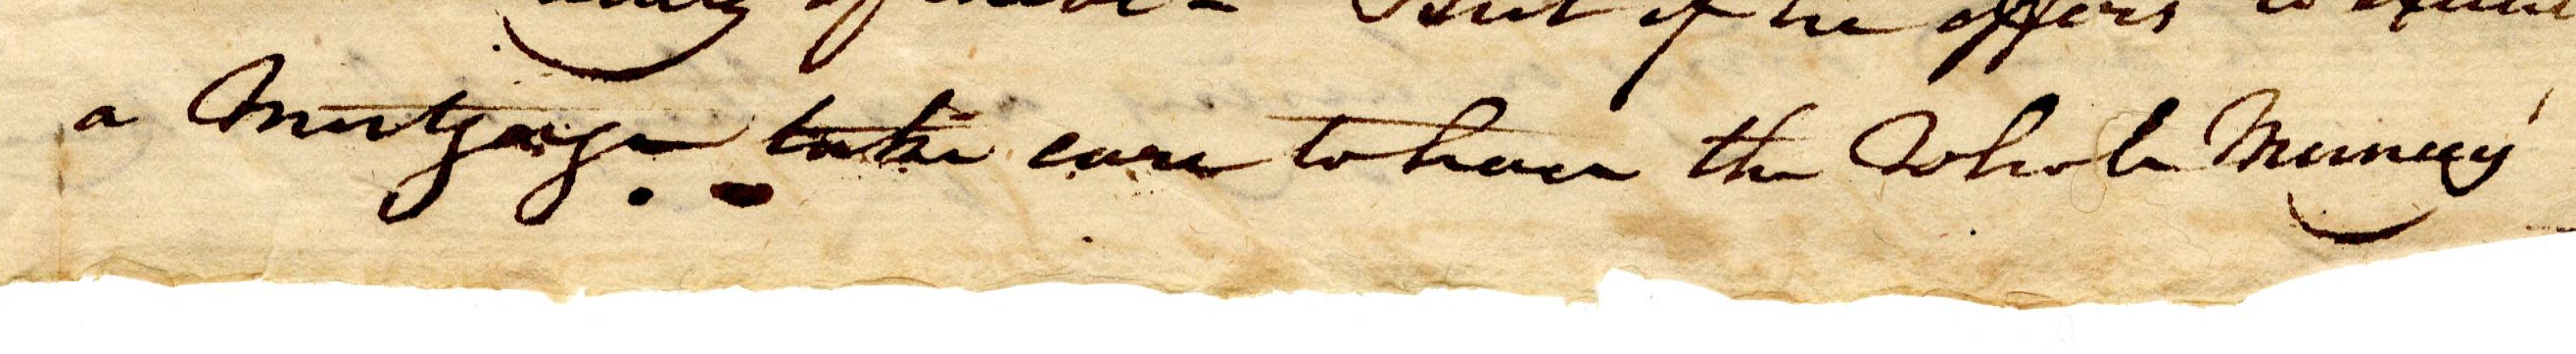a mortgage take care to have the Whole Monney
